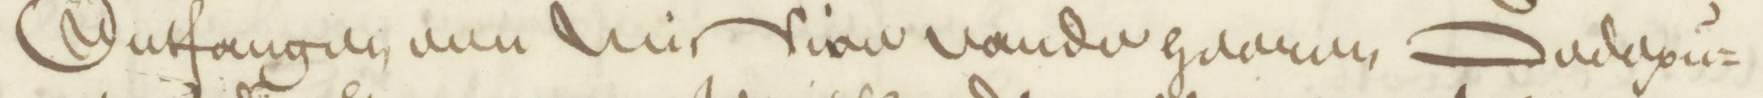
Ontfangen een Missive vande heeren Gedepu=
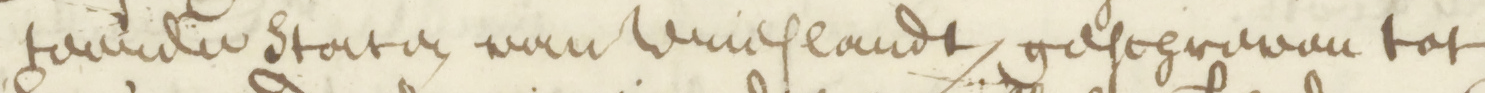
„teerde Staten van Vrieslandt, geschreven tot
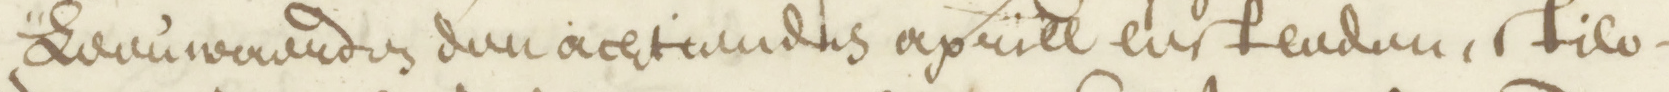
Leeuwaerden den achtienden aprill lestleden, stilo
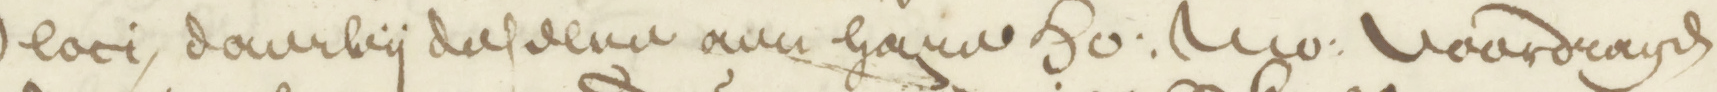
loci, daerbij deselve aen hare Ho:Mo: voordragen
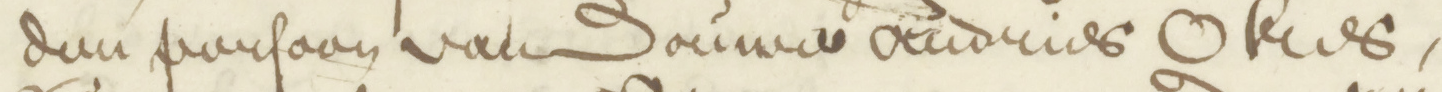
den persoon van Douwe Andries Okes,
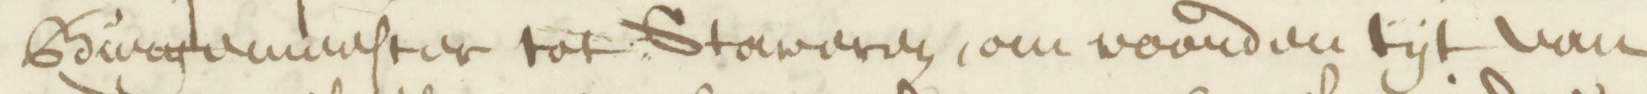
Burgemeester tot Staveren, om voorden tijt van
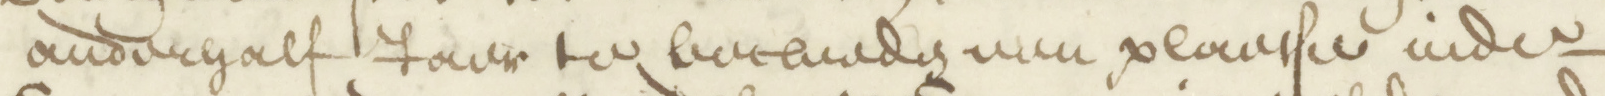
anderhalf Jaer te becleeden een plaetse inde
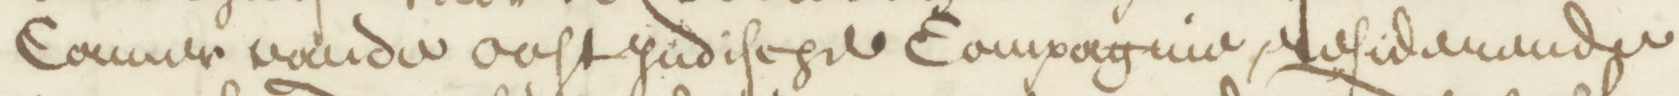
Camer vande oostIndische Compagnie, residerende
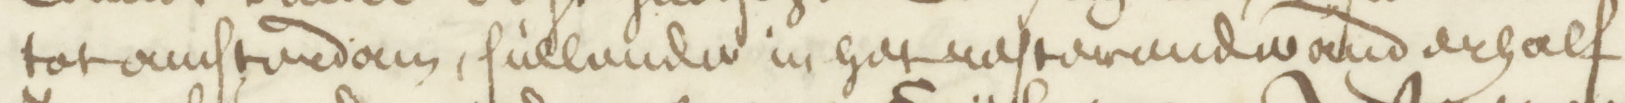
tot amsterdam, sullende in het resterende anderhalf
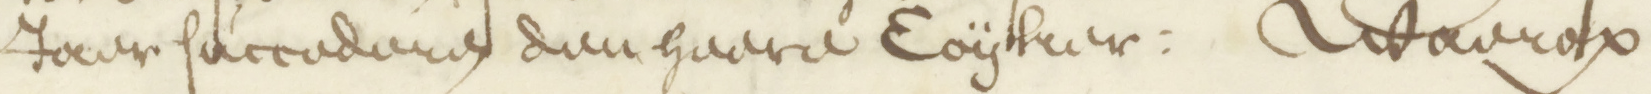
Jaer succederen den heere Coijker: Waerop
